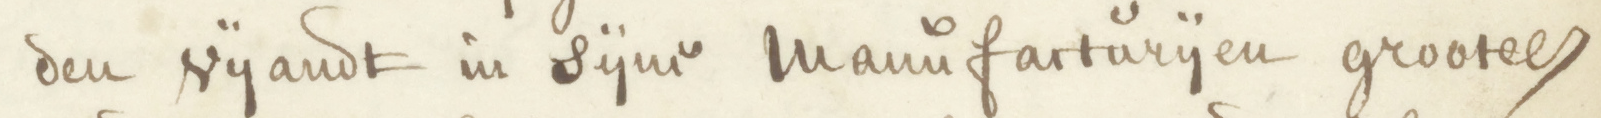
den vijandt in sijne manufacturijen grootel
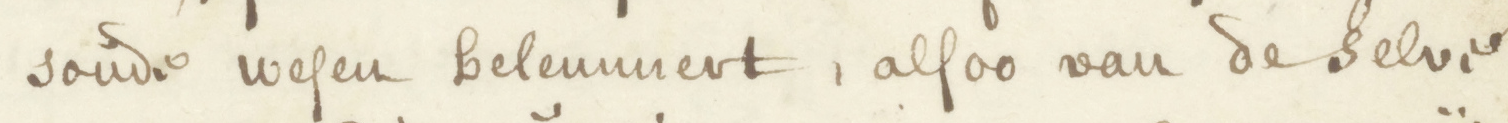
soude wesen belemmert, alsoo van deselve
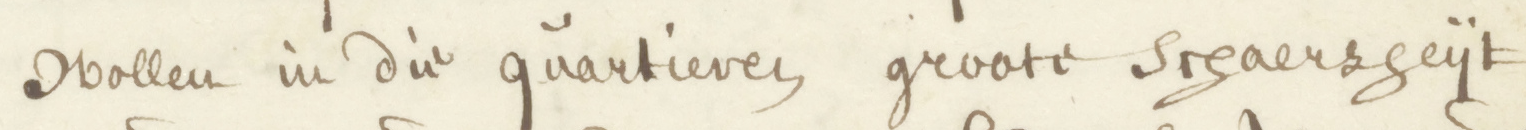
Wollen in die quartieren groote schaersheijt
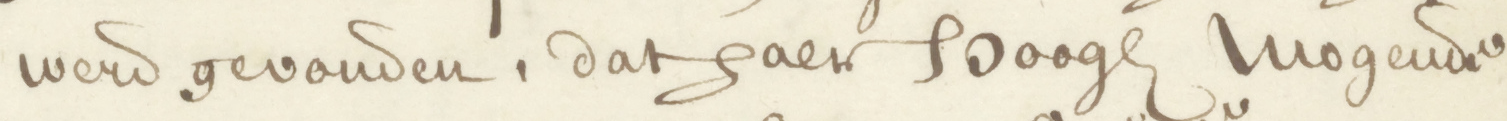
werd gevonden, dat haer Hoogh Mogende
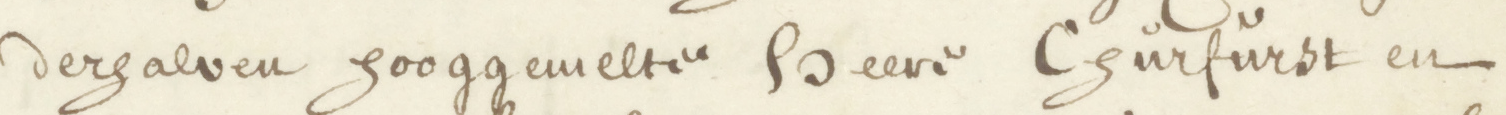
derhalven hooggemelte Heere Churfurst en
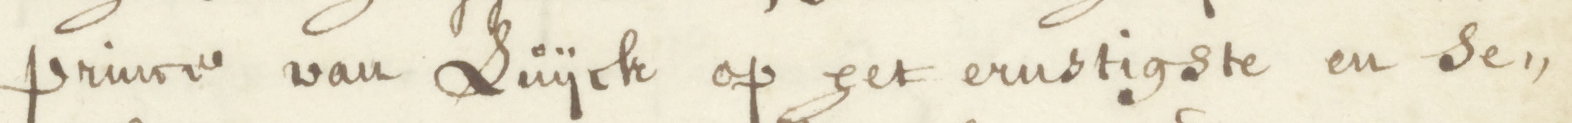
Prince van Luijck op het ernstigste en se„
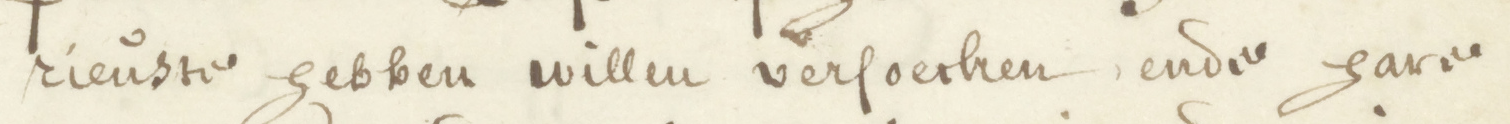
„rieuste hebben willen versoecken, ende hare
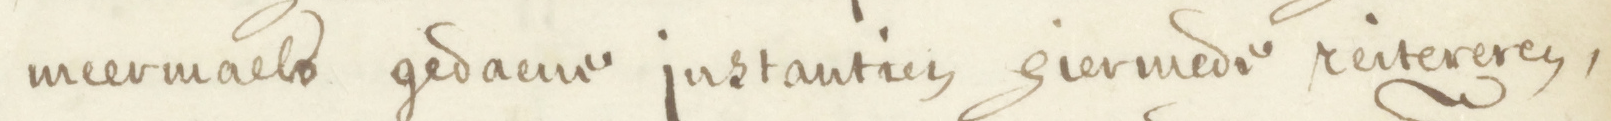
meermaels gedaene instantien hiermede reitereren,
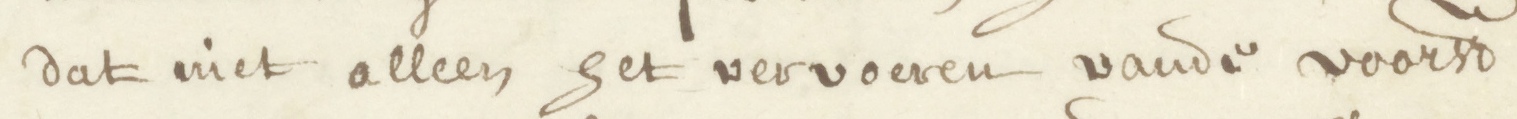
dat niet alleen het vervoeren vande voors
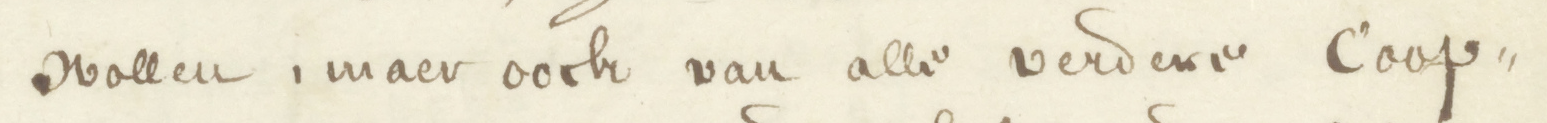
Wollen, maer oock van alle verdere Coop„
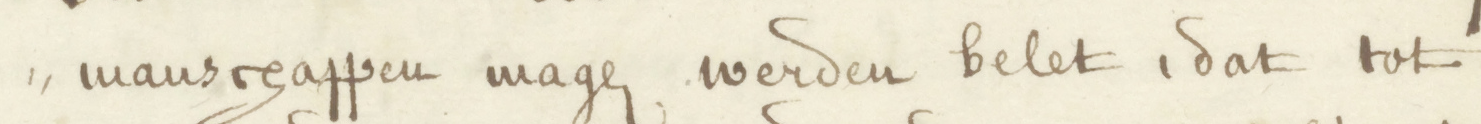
„manschappen magh werden belet, dat tot
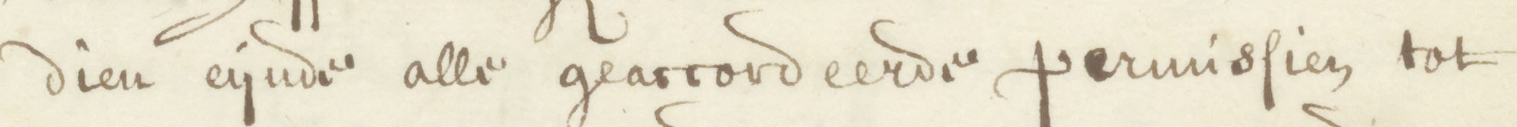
dien eijnde alle geaccordeerde permissien tot
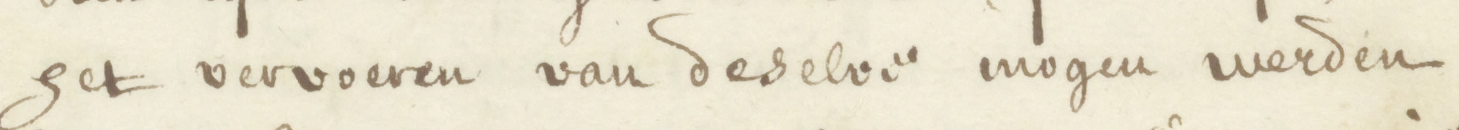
het vervoeren van deselve mogen werden
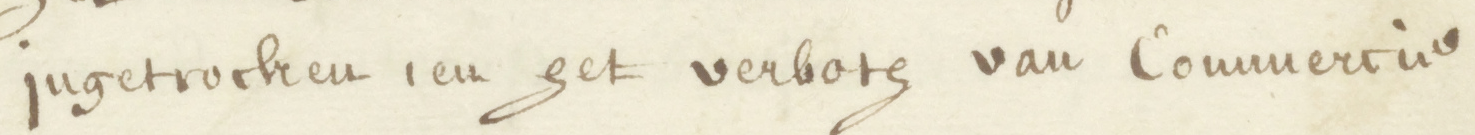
ingetrocken, en het verboth van Commercie
